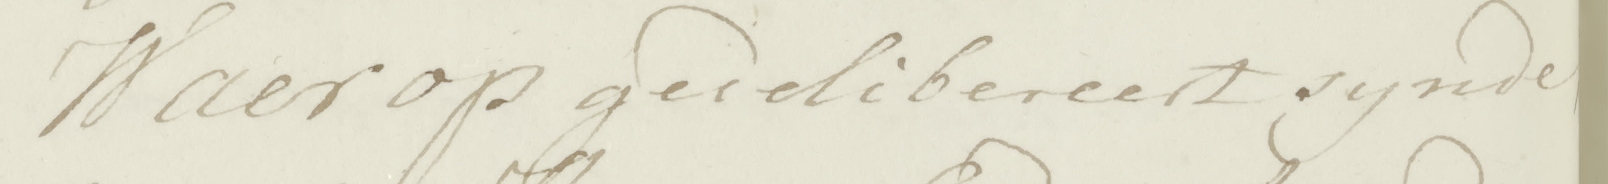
Waerop gedelibereert synde
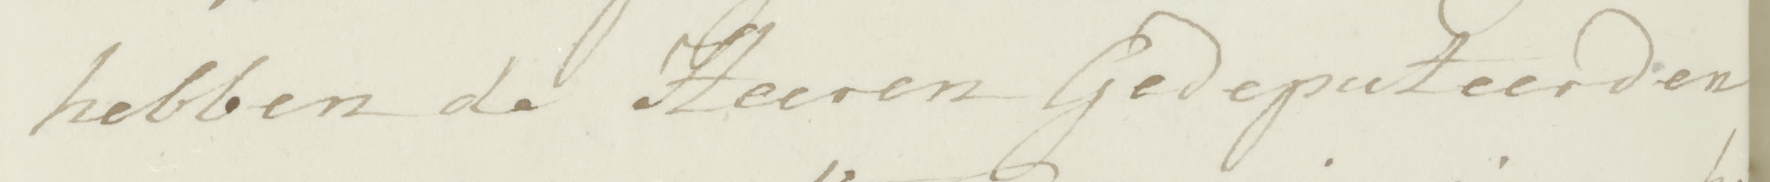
hebben de Heeren Gedeputeerden
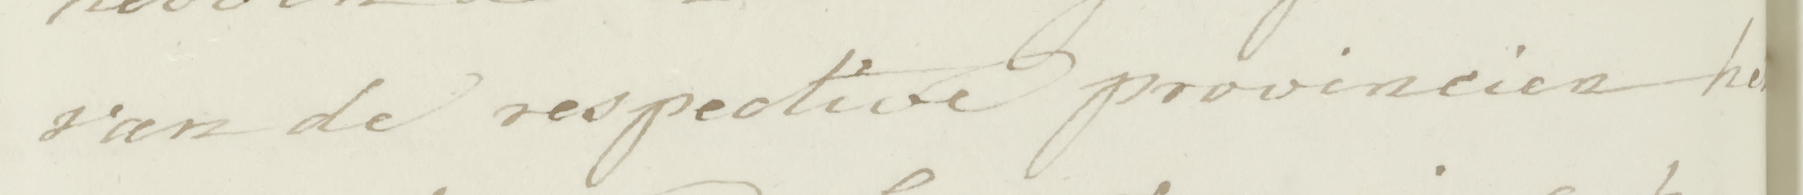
van de respective provincien he
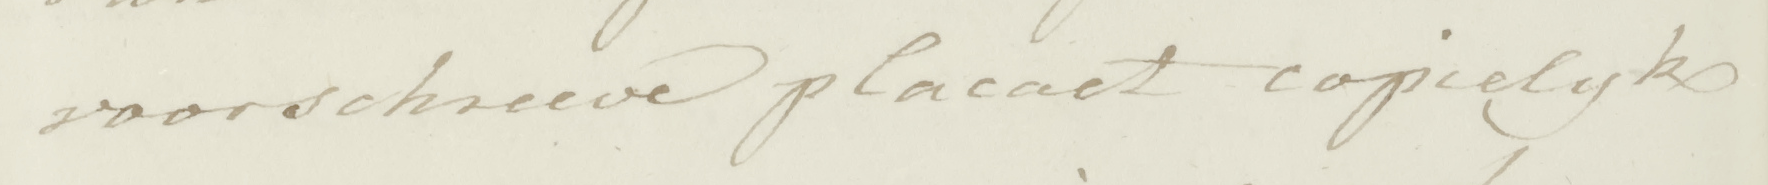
voorschreeve placaat copieljk
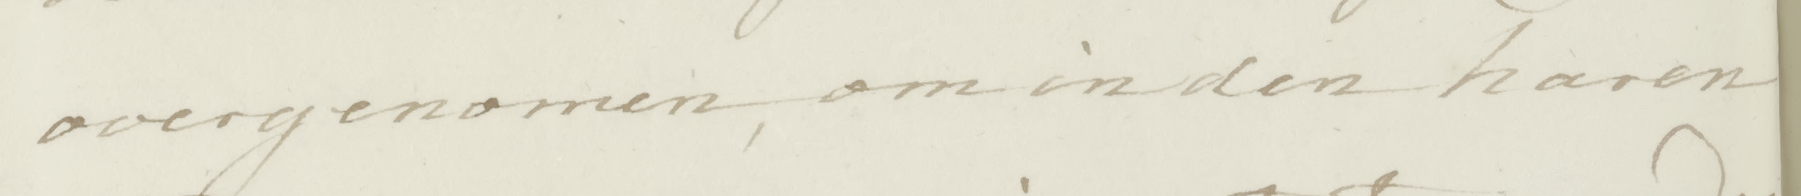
overenomen, om in den haren
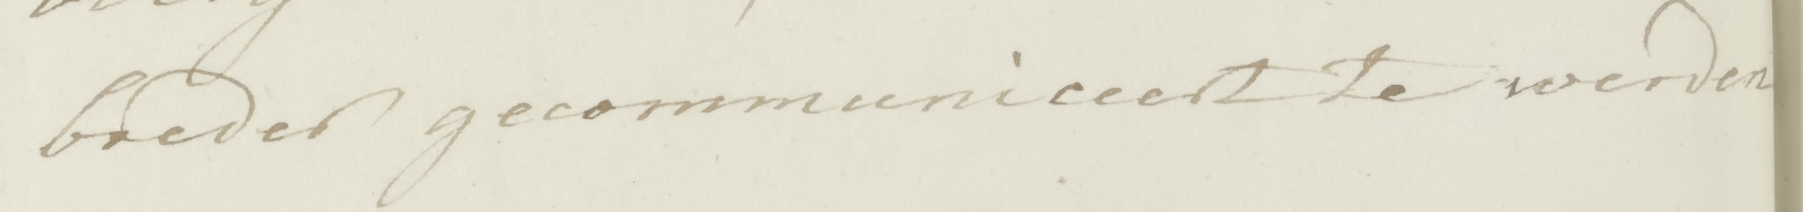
breder gecommuniceert te werden
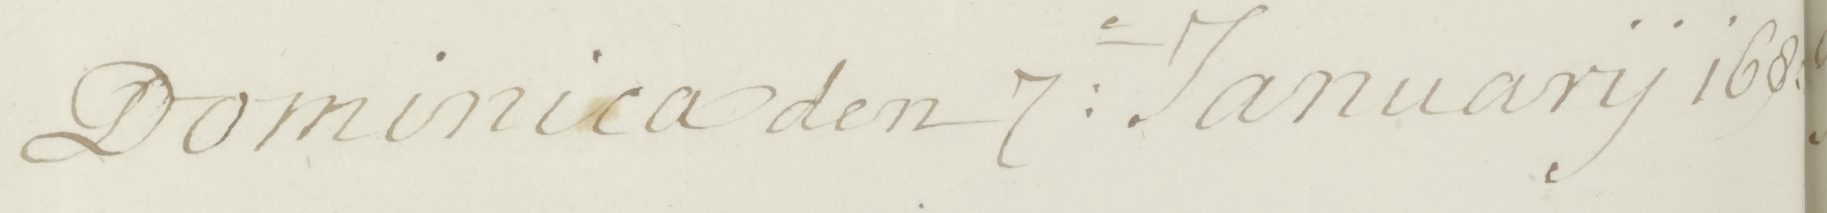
Dominica den 7e: Januarij 168
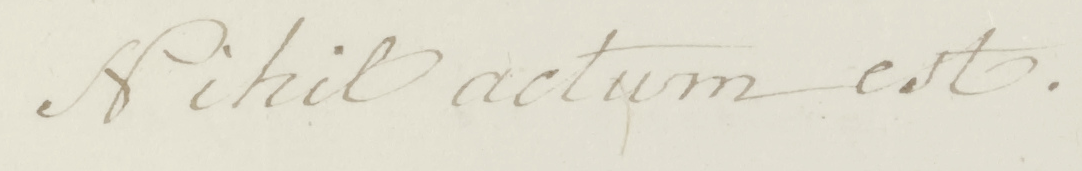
Nihil actum est.
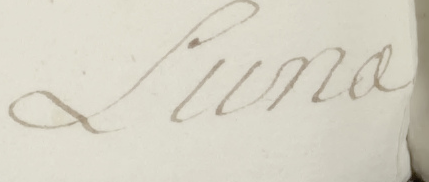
Luna
